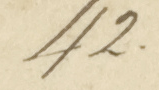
42
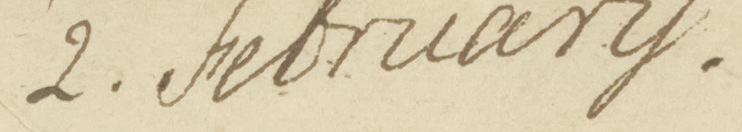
2. Februarij.
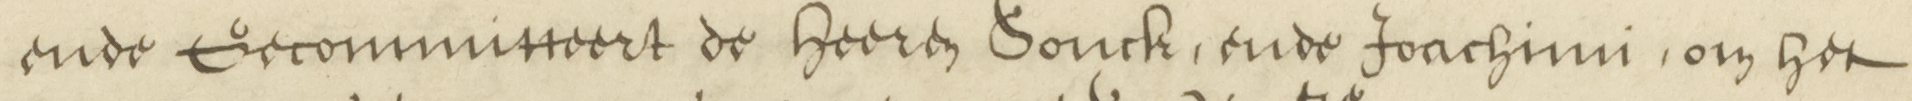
ende gecommitteert de heeren Sonck ende Joachimi, om het
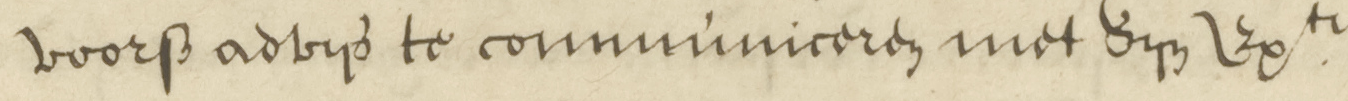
voors advys te communiceren met Syn Extie.
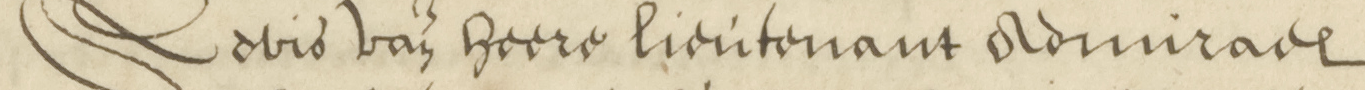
Advis van heere lieutenant Admirael
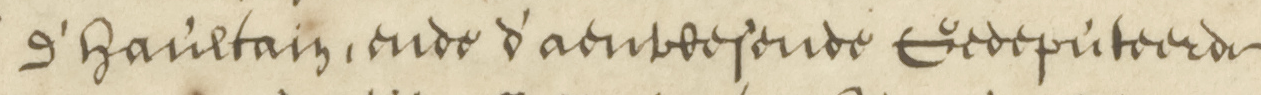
d'Haultain, ende d'aenwesende Gedeputeerde
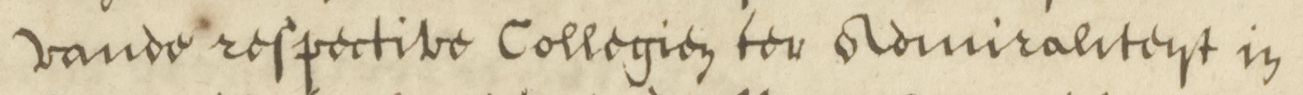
vande respective Collegien ter Admiraliteyt in
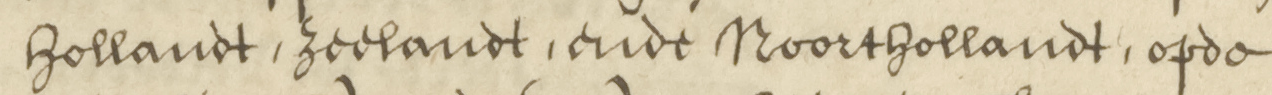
Hollandt, Zeelandt, ende Noorthollandt, opde
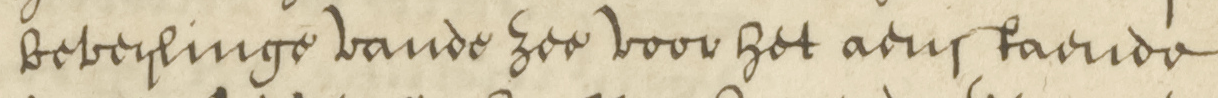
beveylinge vande zee voor het aenstaende
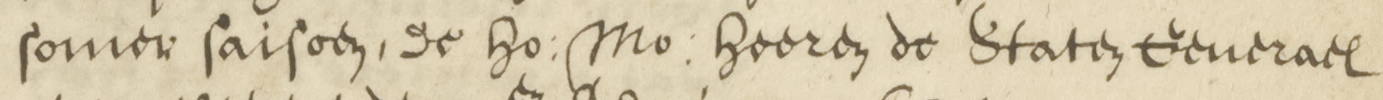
somer saisoen, de Ho:Mo: heeren de Staten Generael
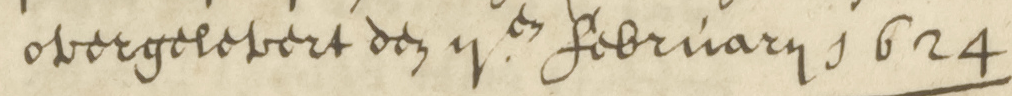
overgelevert den ijen february 1624.
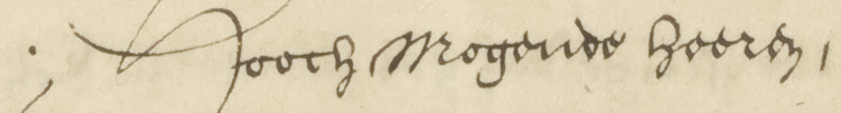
Hooch Mogende heeren,
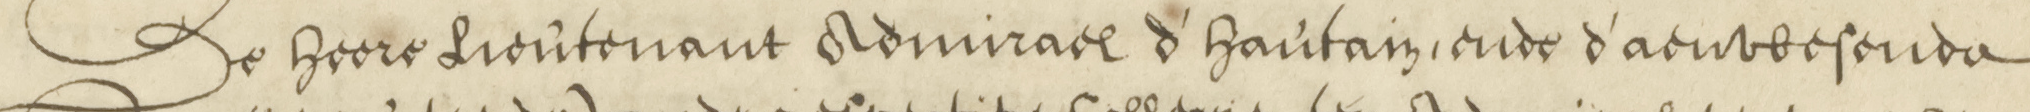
De heere Lieutenant Admirael d'Haultain ende d'aenwesende
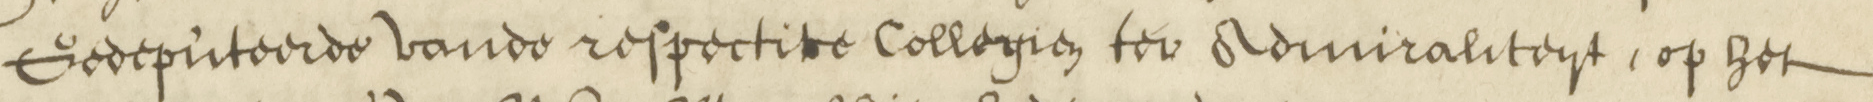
Gedeputeerde vande respective Collegien ter Admiraliteyt, op het
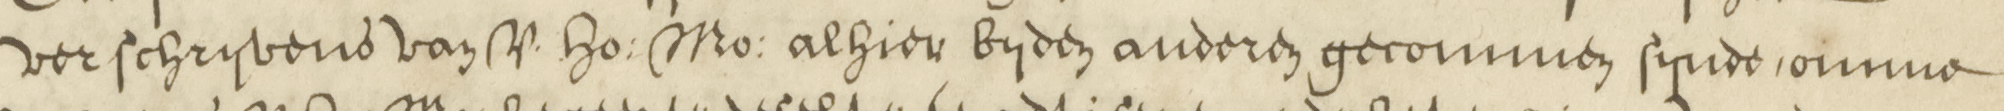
verschrijvens van U. Ho:Mo: alhier byden anderen gecommen synde, omme
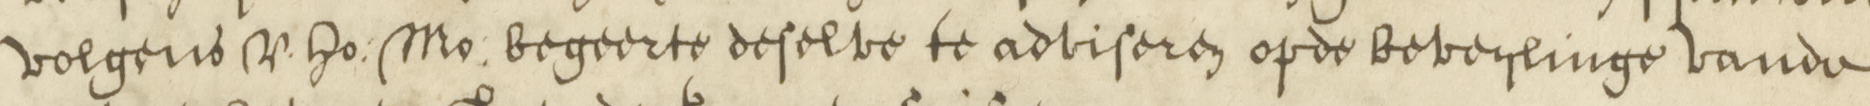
volgens U. Ho:Mo: begeerte deselve te adviseren opde beveylinge vande
